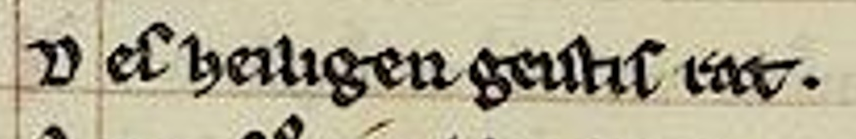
Deſ heiligen geiſtiſ rat.
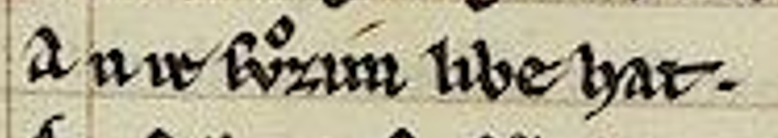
An ir ſv°ozin libe hat.
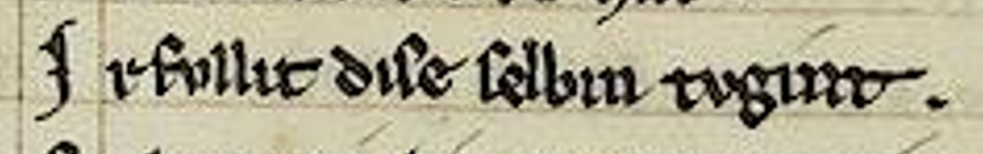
Irfvllit diſe ſelbin tvgint.
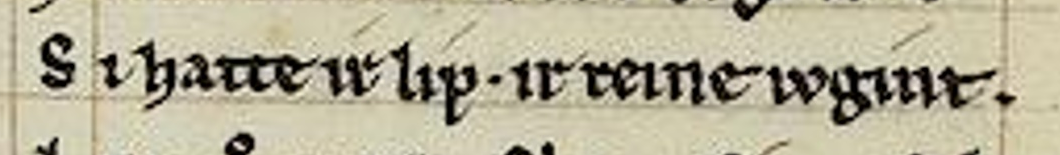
Si hatte ir lip. ir reine ivgint.
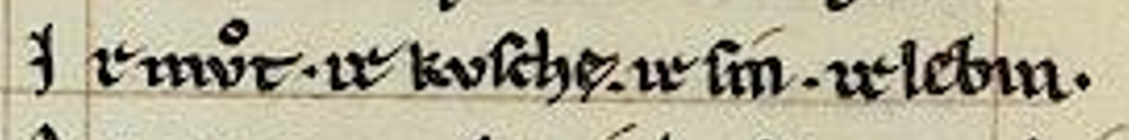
Ir mv°ot. ir kvſche. ir ſin. ir lebin.
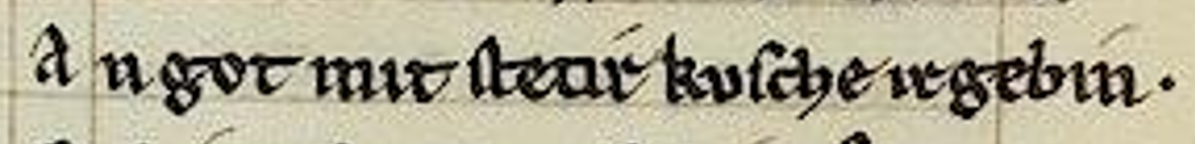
An got mit ſtetir kvſche irgebin.
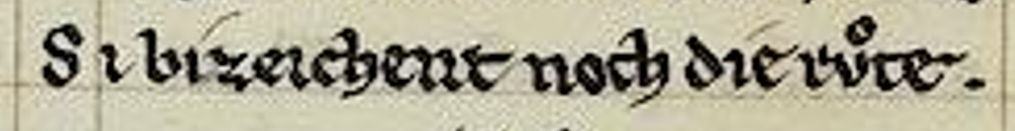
Si bizeichent noch die rv°ote.
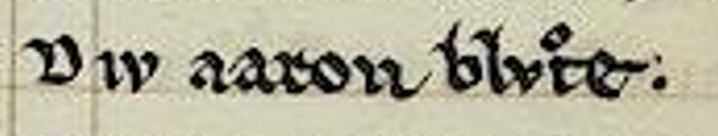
Div aaron blv°ote.
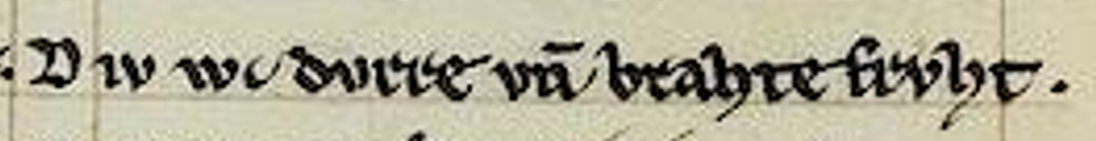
Div w(az) dvrre vn(d) brahte frvht.
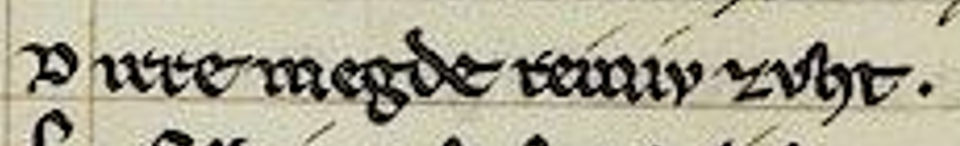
Dirre megde reiniv zvht.
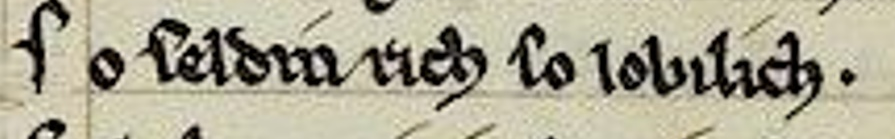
ſo ſeldin rich ſo lobilich.
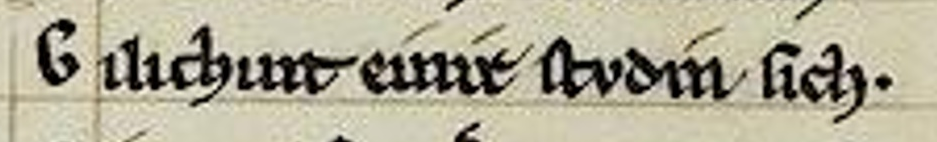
Gilichint einir ſtvdin ſich.
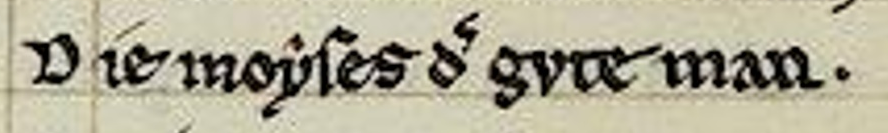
Die moyſes d(er) gvte man.
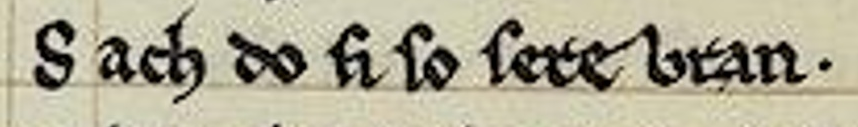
Sach do ſi ſo ſere bran.
